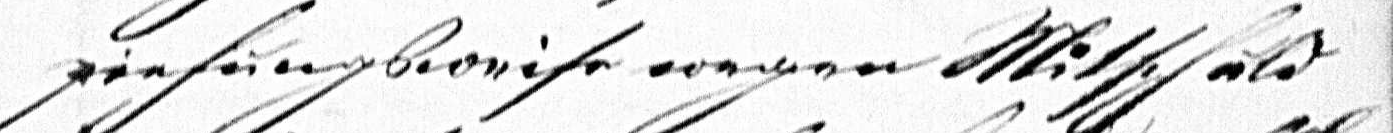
ziehungsweise wegen Mitschuld
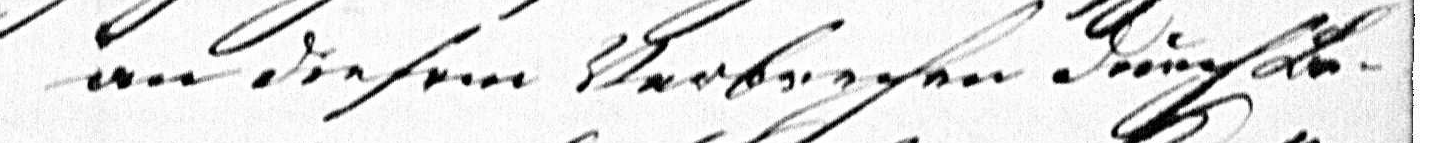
an diesem Verbrechen durch Be¬
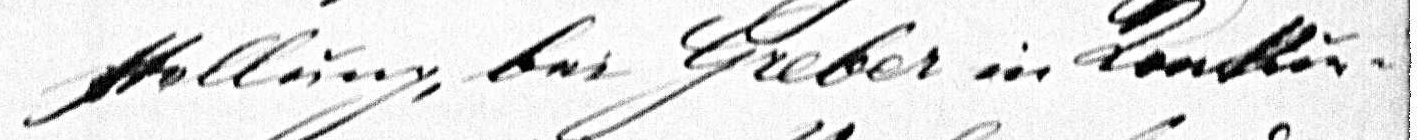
stellung, bei Greber in Konkur¬
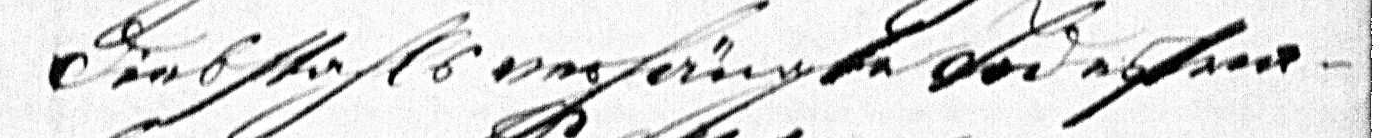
Diebstahls verhängte Todesstra¬
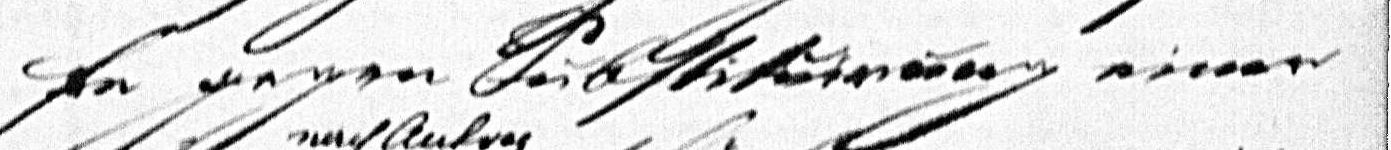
fe gegen Substituirung einer
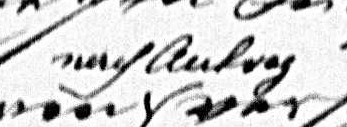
nach Antrag
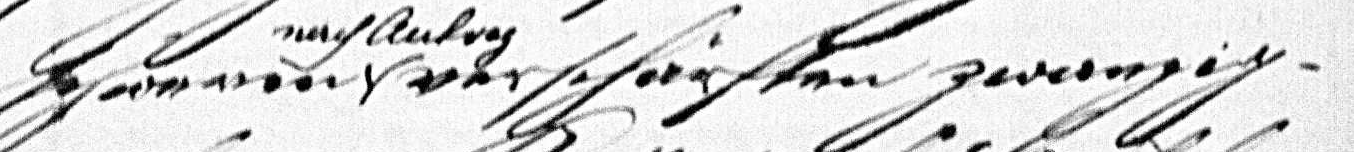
schweren verschärften zwanzig¬
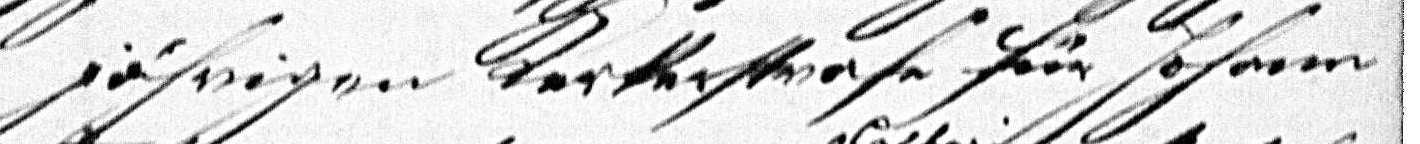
jährigen Kerkerstrafe für Johann
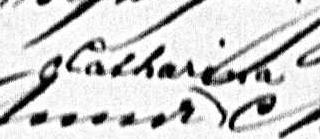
Catharina
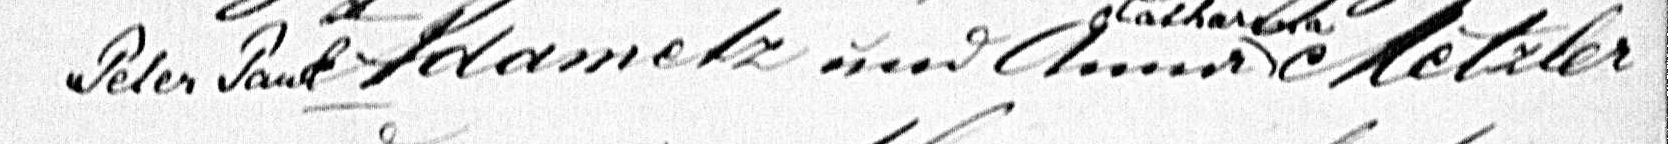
Peter Paul Adametz und Anna Metzler
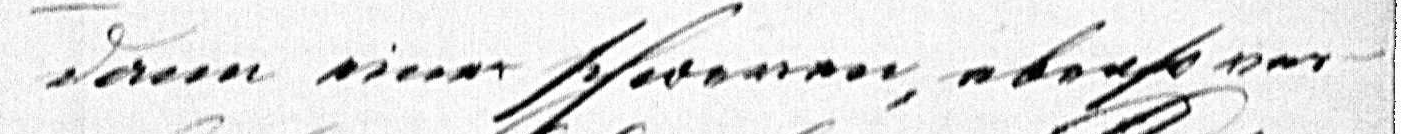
dann einer schweren ebenso ver¬
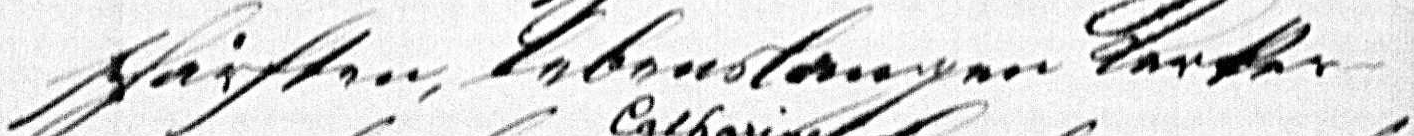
schärften, lebenslangen Kerker¬
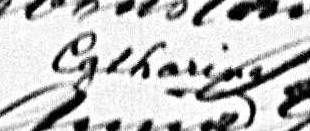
Catharina
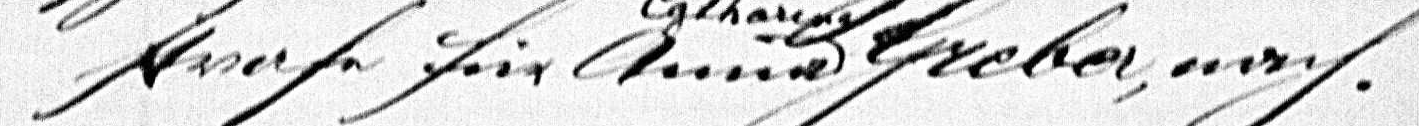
strafe für Anna Greber, nach.
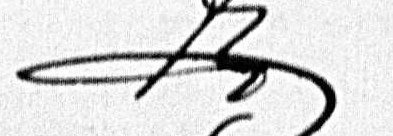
FJ
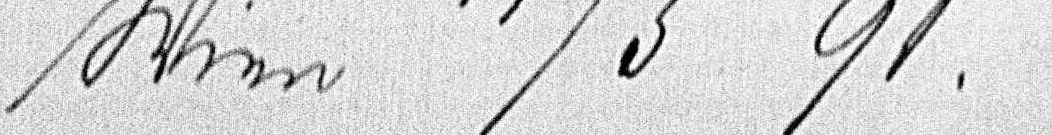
Wien 11/5/1891
